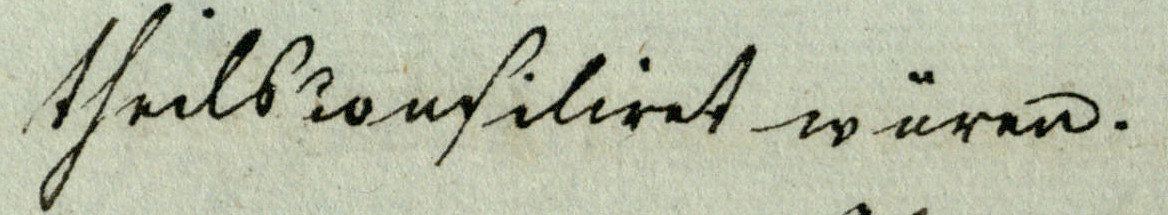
theils consiliret wären.
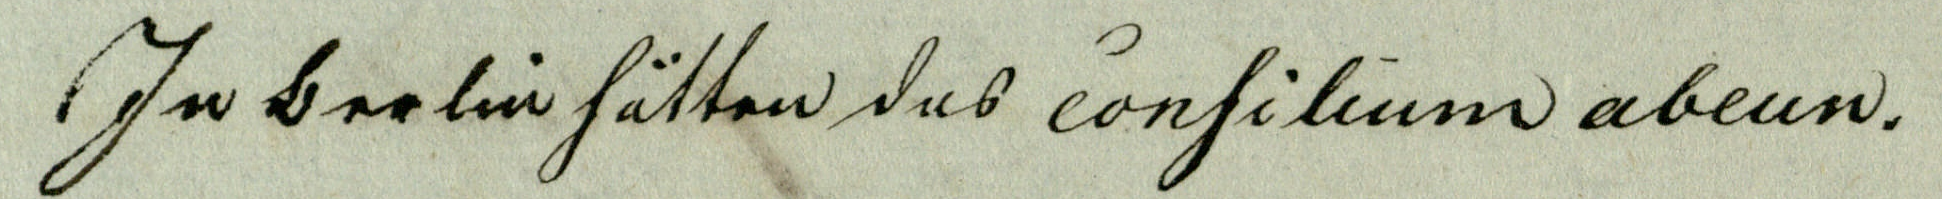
In berlin hätten das consilium abeun¬
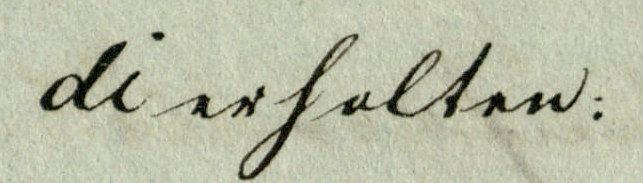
di erhalten:
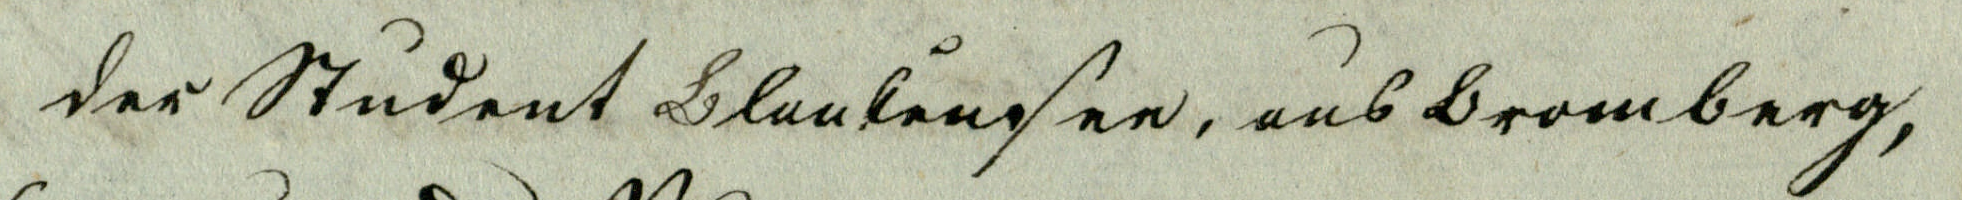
der Student Blankensee, aus Bromberg,
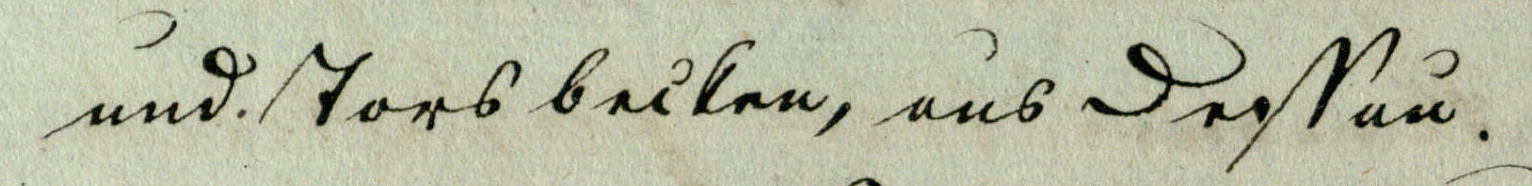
und Torsbecken aus Dessau.
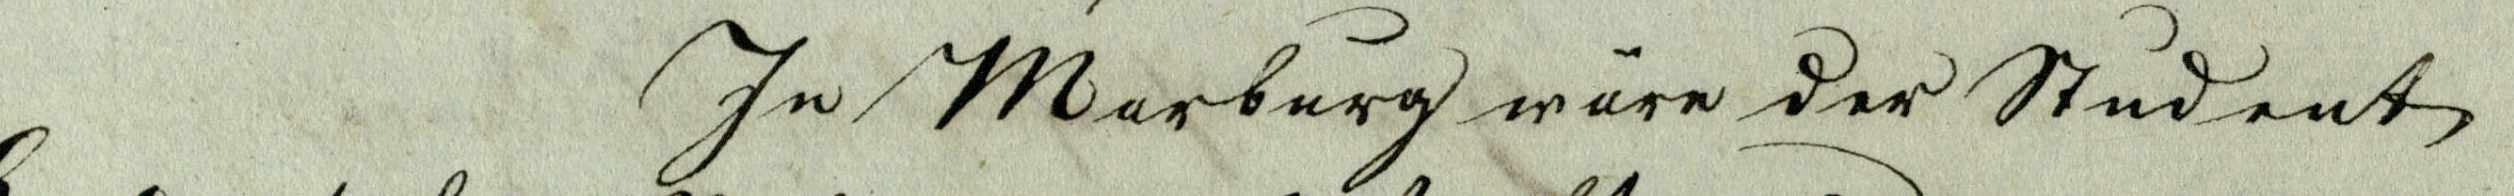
In Marburg wäre der Student
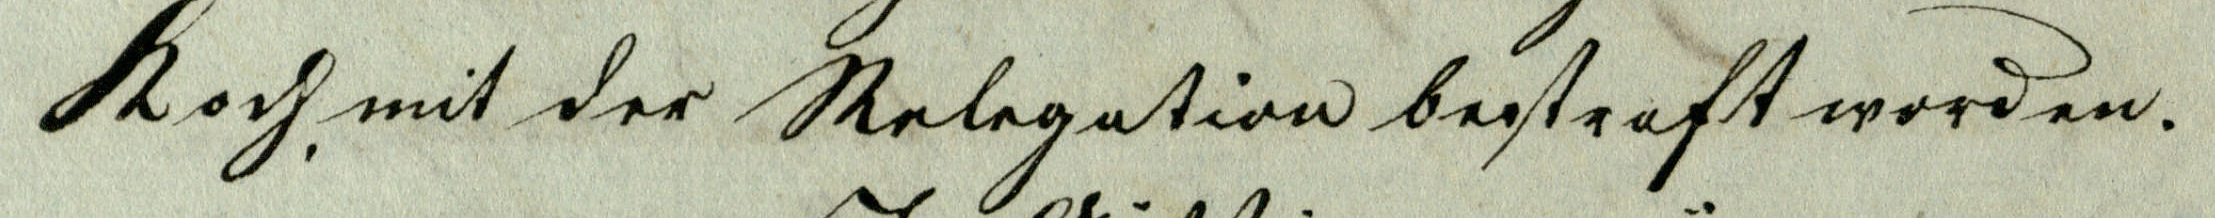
Koch mit der Relegation bestraft worden.
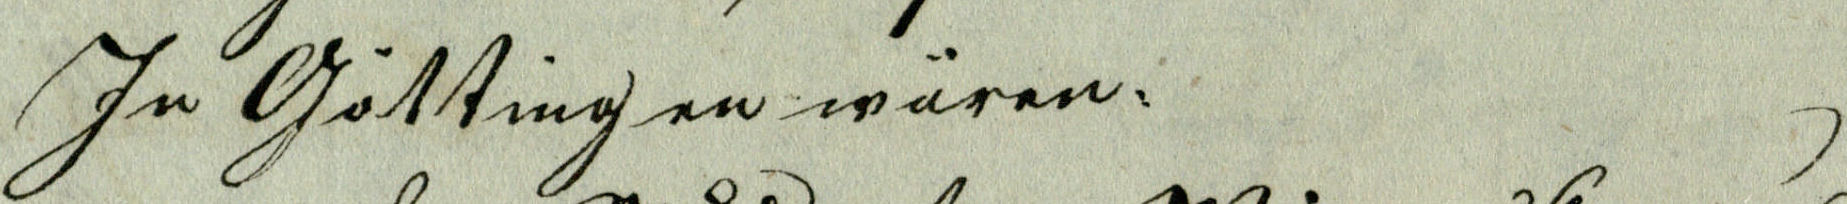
In Göttingen wären:
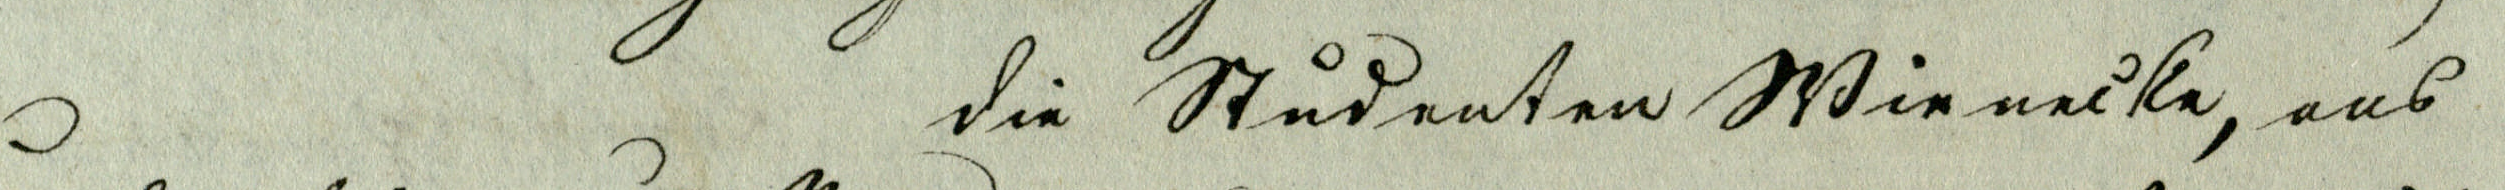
die Studenten Wienecke, aus
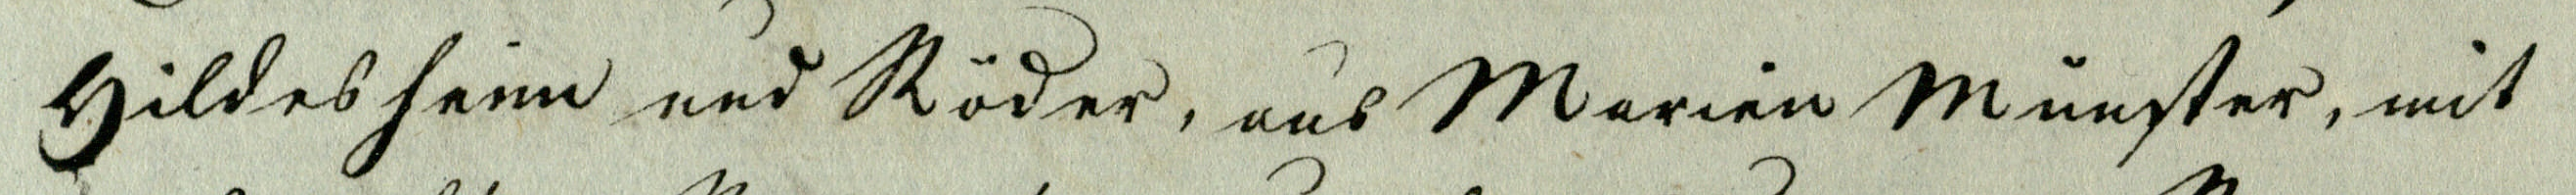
Hildesheim und Röder, aus Marien Münster, mit
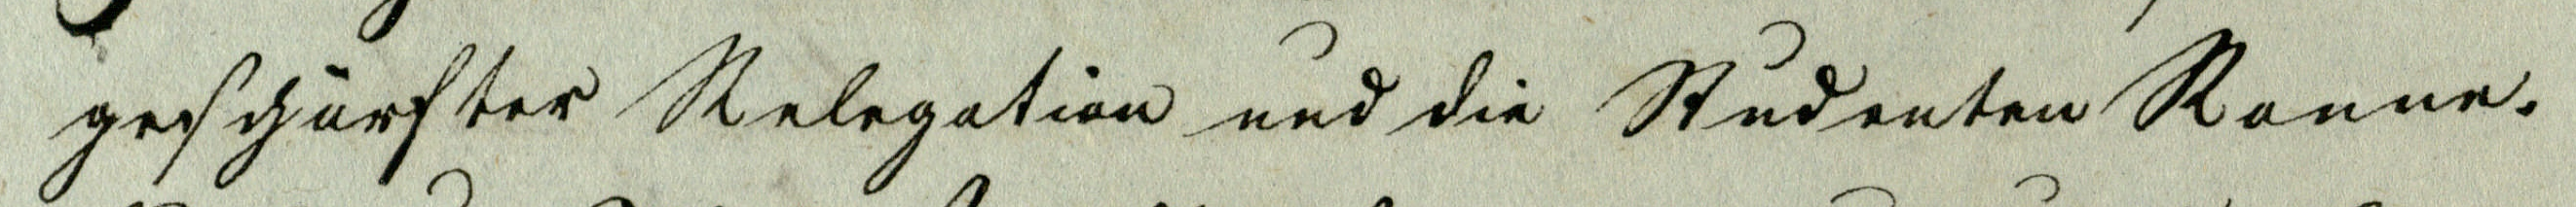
geschärfter Relegation und die Studenten Ronne¬
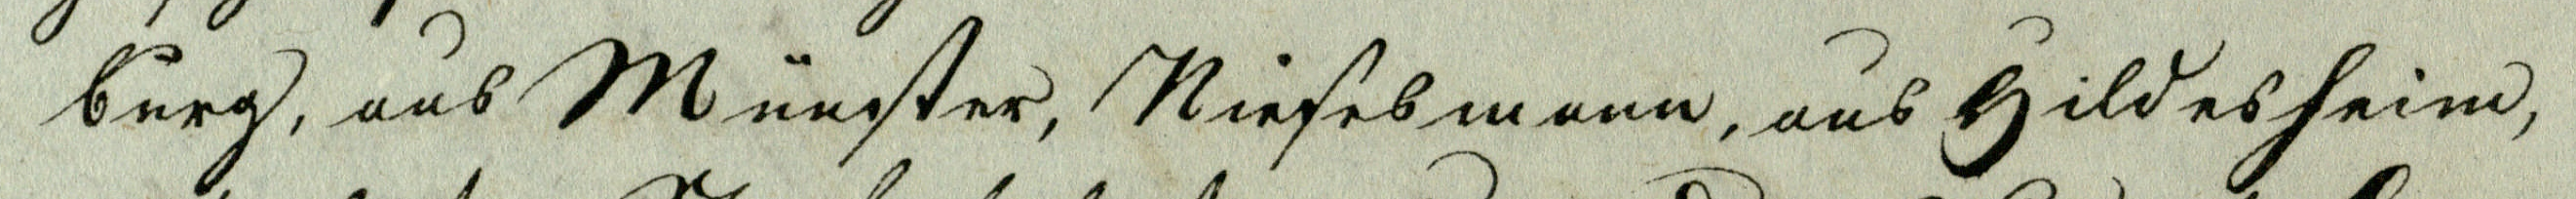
burg, aus Münster, Nieselmann, aus Hildesheim,
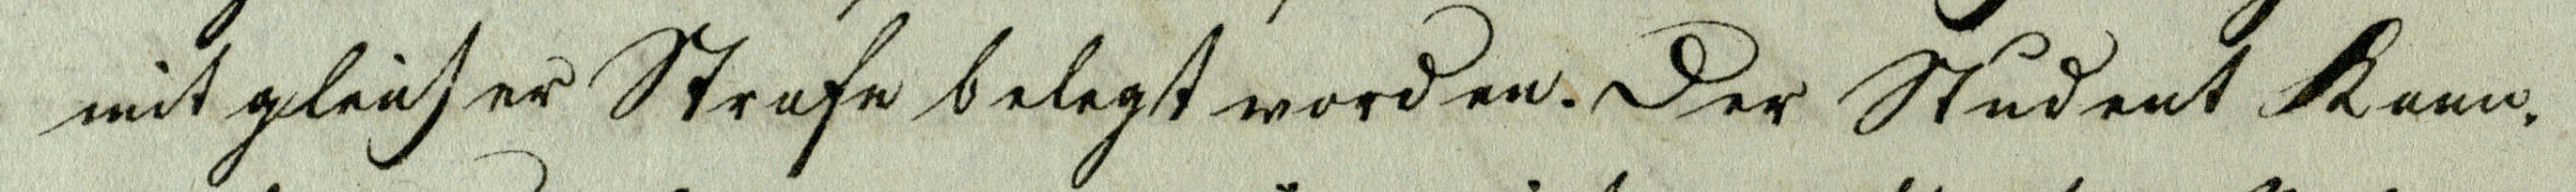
mit gleicher Strafe belegt worden. Der Student Kann¬
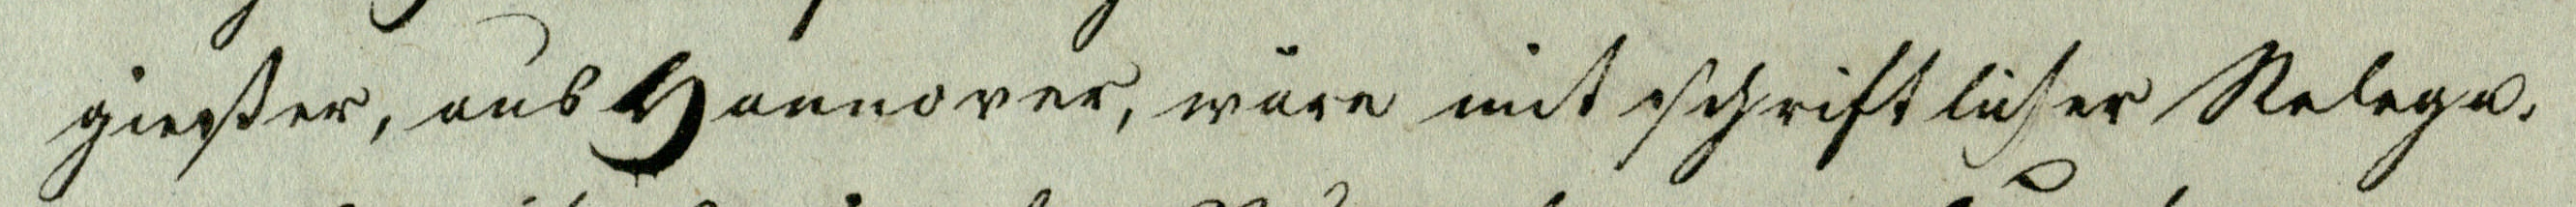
gießer, aus Hannover, wäre mit schriftlicher Relega¬
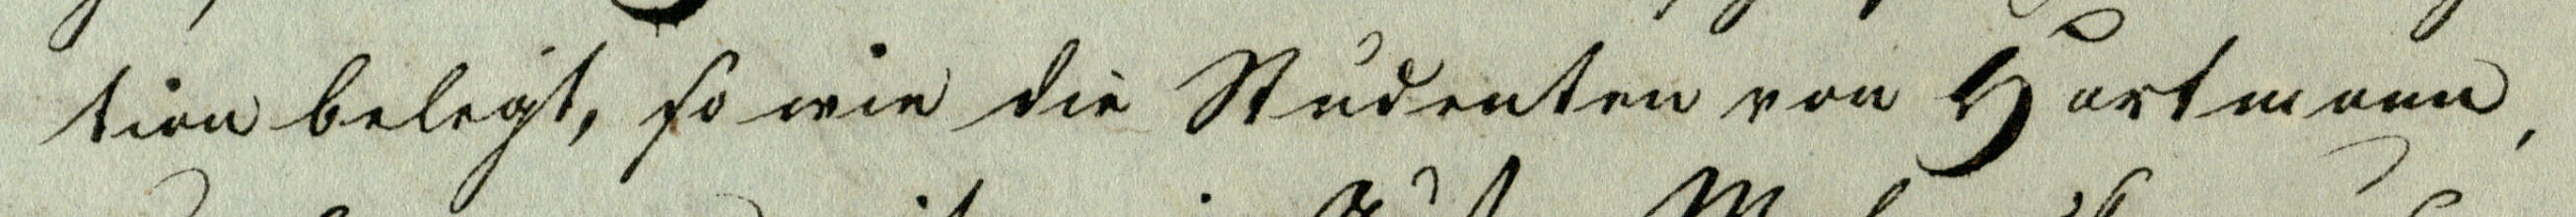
tion belegt, so wie die Studenten von Hartmann,
